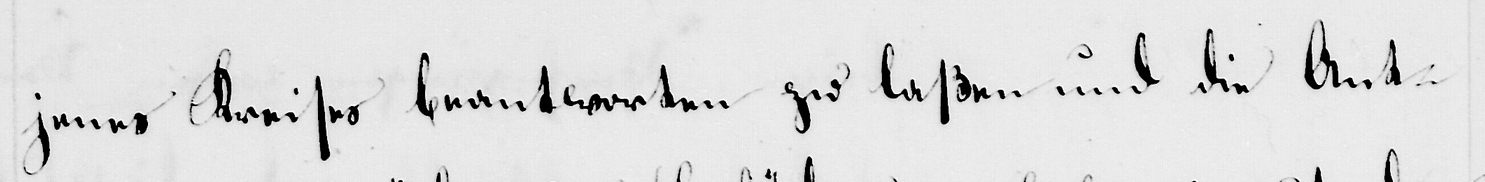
jenes Kreises beantworten zu laßen und die Ant¬
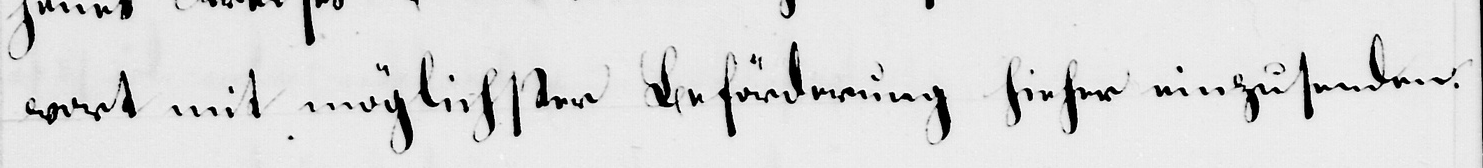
wort mit möglichster Beförderung hieher einzusenden.
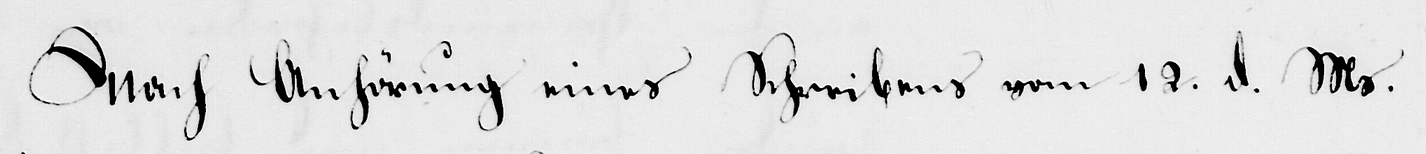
Nach Anhörung eines Schreibens vom 12. d. Ms.
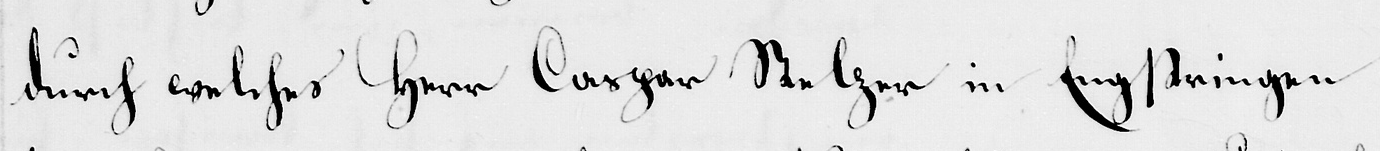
durch welches Herr Caspar Stelzer in Engstringen
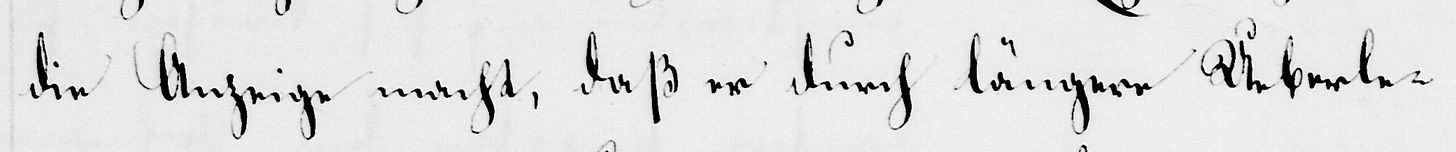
die Anzeige macht, daß er durch längere Ueberle¬
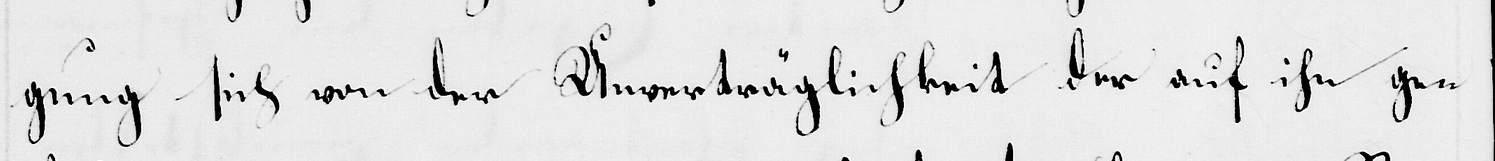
gung sich von der Unverträglichkeit der auf ihn ge¬
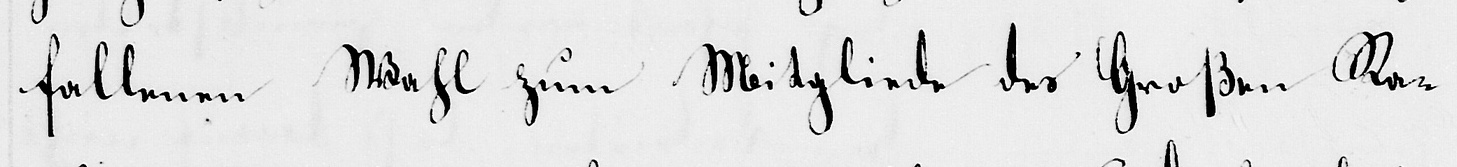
fallenen Wahl zum Mitgliede des Großen Ra¬
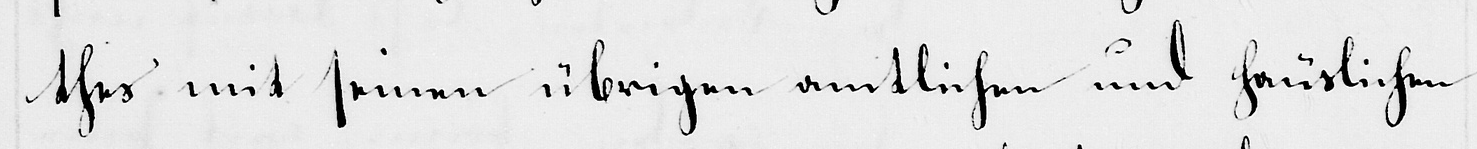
thes mit seinen übrigen amtlichen und häuslichen
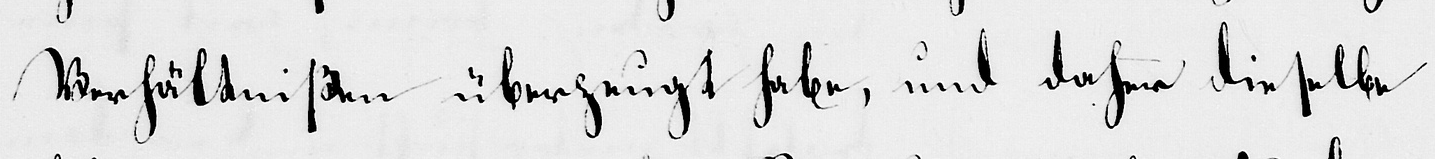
Verhältnißen überzeugt habe, und daher dieselbe
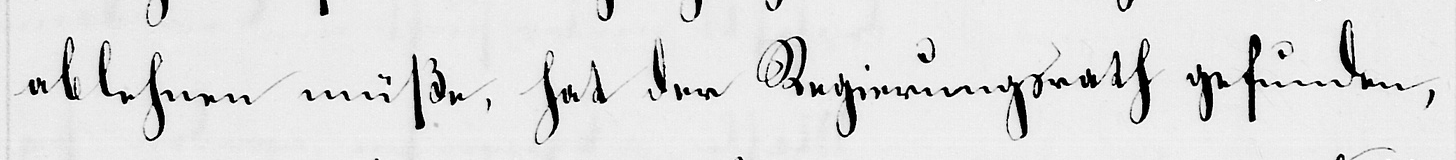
ablehnen müße, hat der Regierungsrath gefunden,
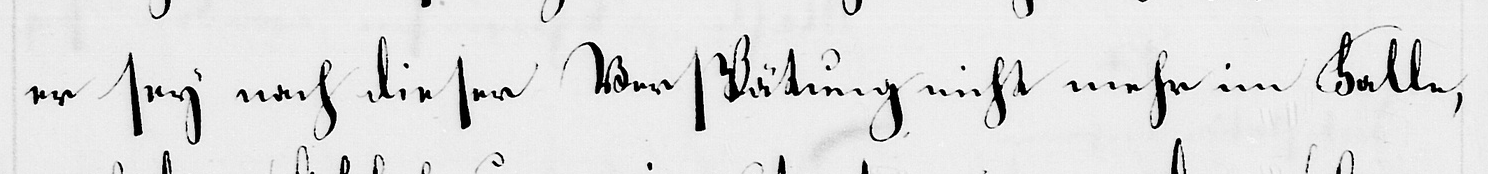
er sey nach dieser Verspätung nicht mehr im Falle,
